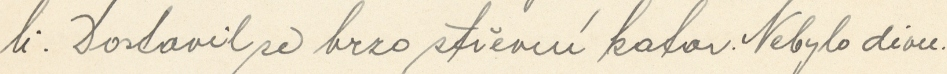li. Dostavil se brzo střevní katar. Nebylo divu.
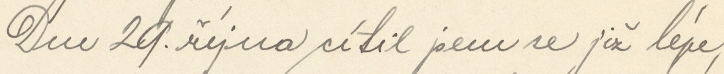Dne 29. října cítil jsem se již lépe,
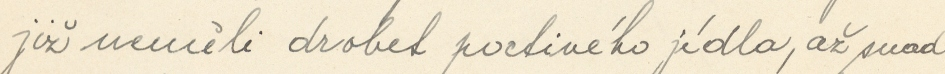již neměli drobet poctivého jídla, až snad
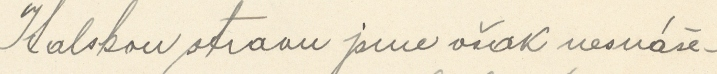Italskou stranu jsme však nesnáše-
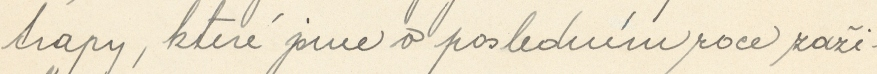trapy, které jsme v posledním roce zažili.
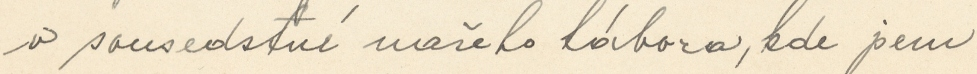v sousedství našeho tábora, kde jsem
